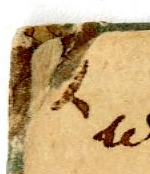2
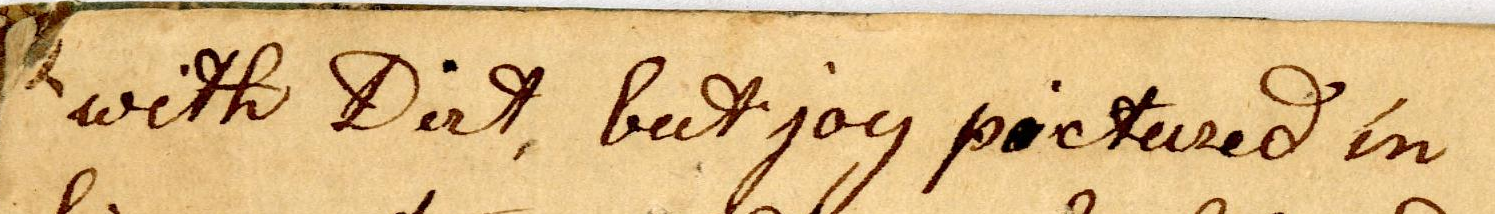with Dirt, but joy pictured in
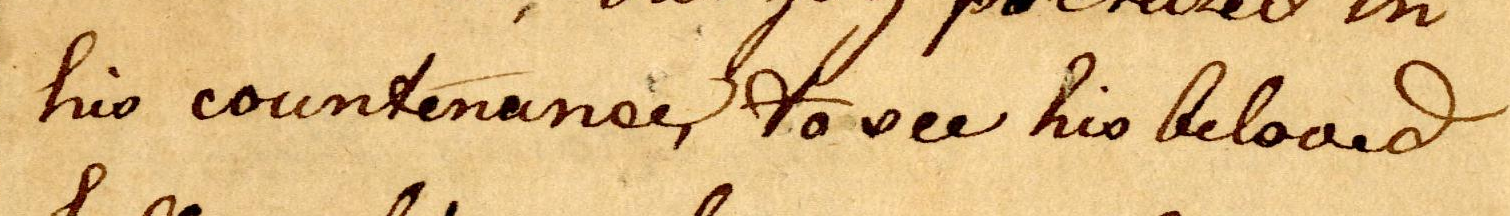his countenance, to see his beloved
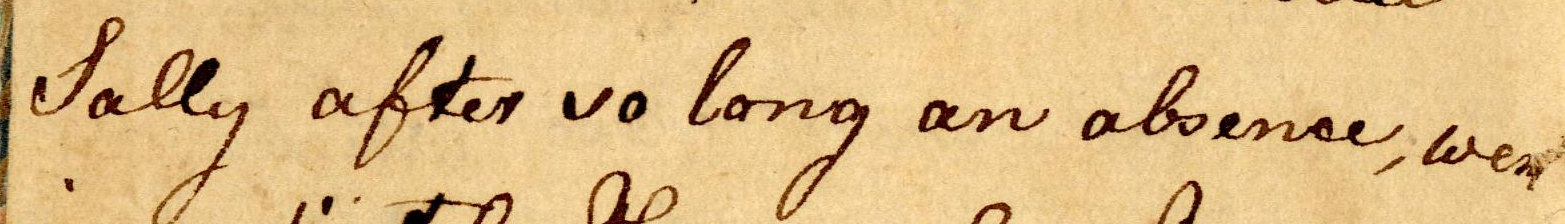Sally after so long an absence, went
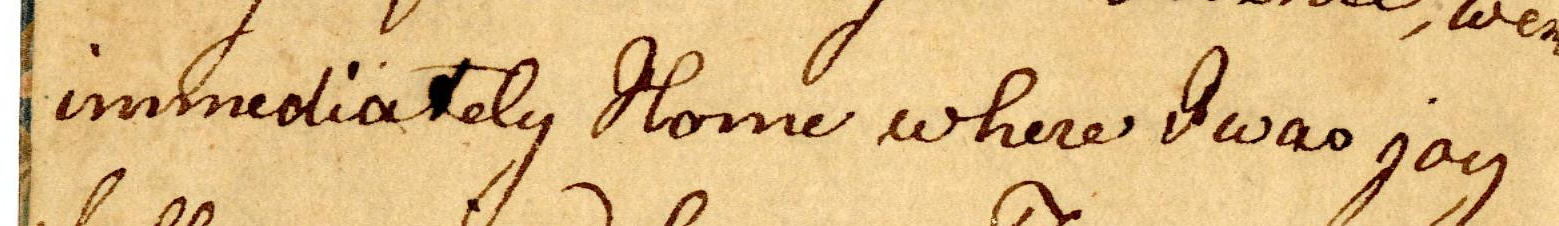immediately Home where I was joy
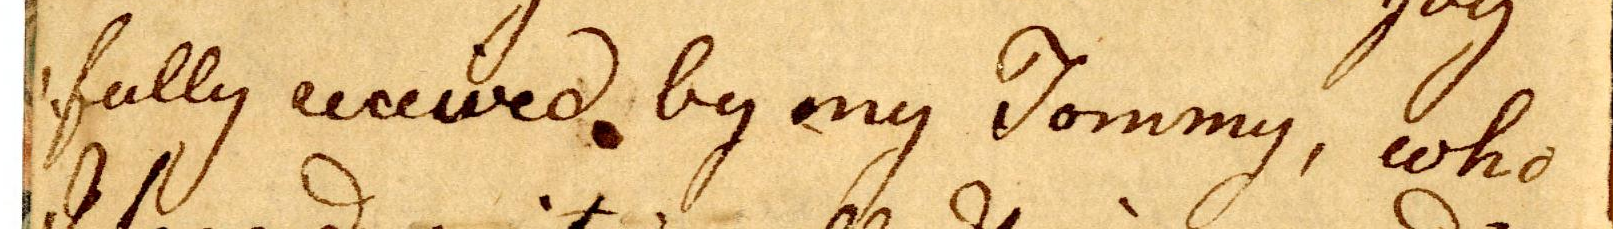-fully received by my Tommy, who
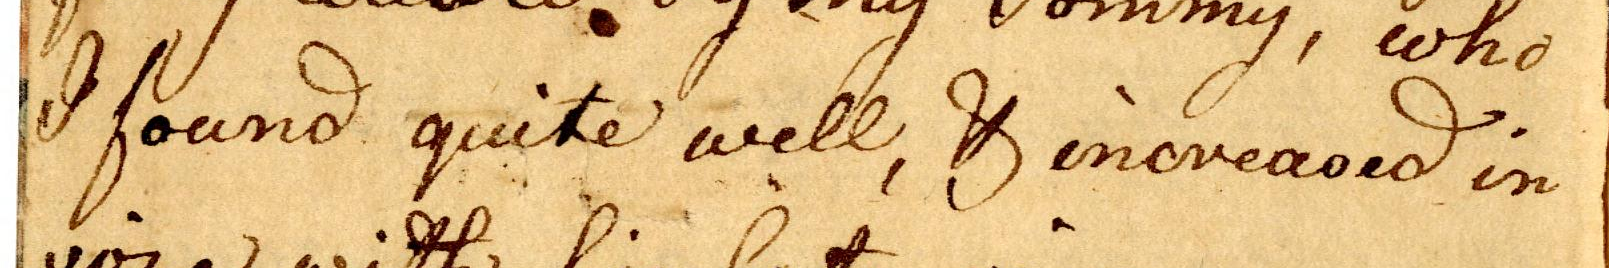I found quite well, & increased in
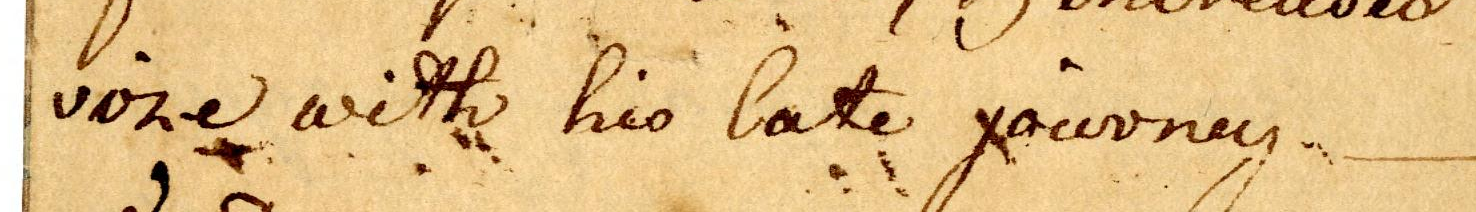size with his late journey
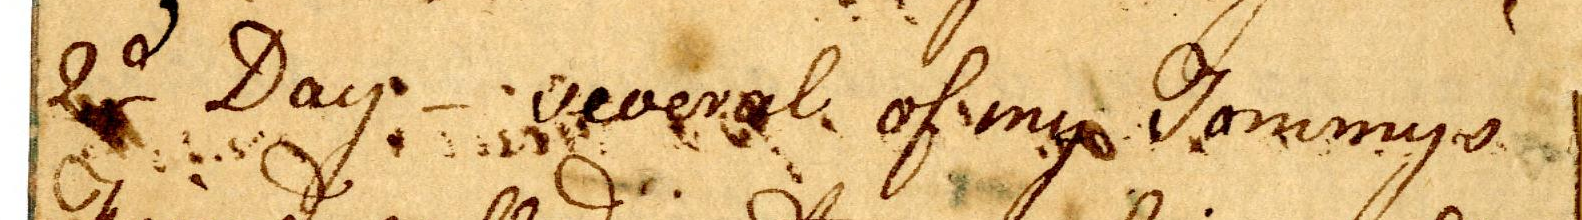2^d Day- several of my Tommys
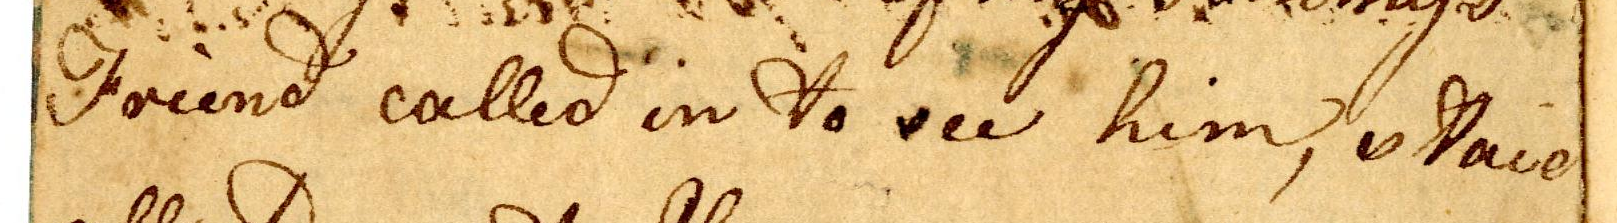Friend called in to see him, staid
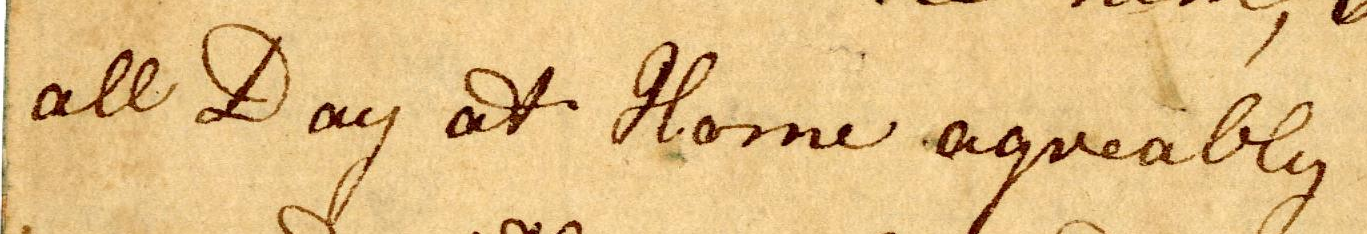all Day at Home agreably
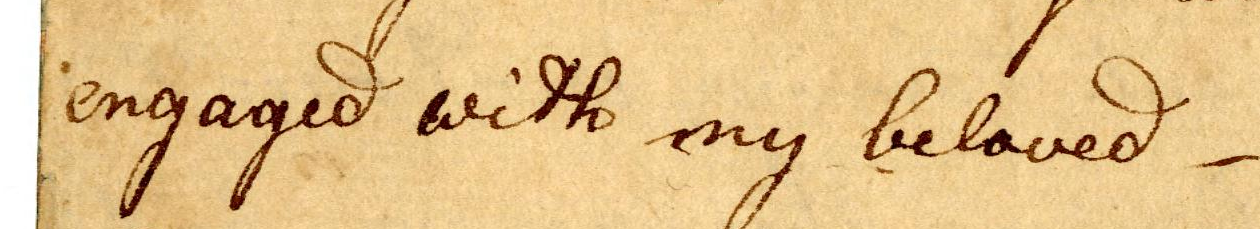engaged with my beloved-
